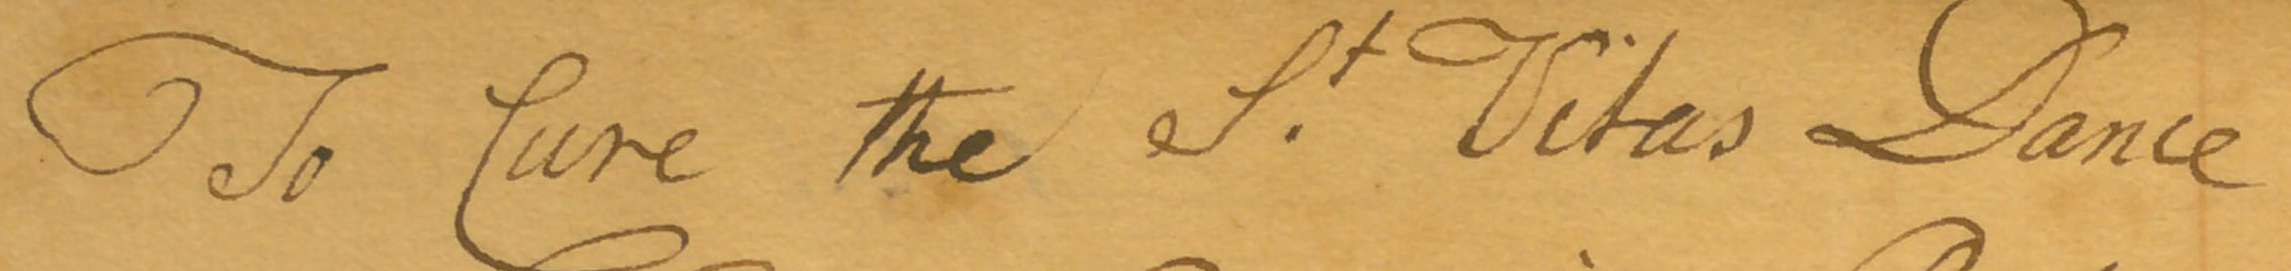To Cure the S^t. Vitas Dance
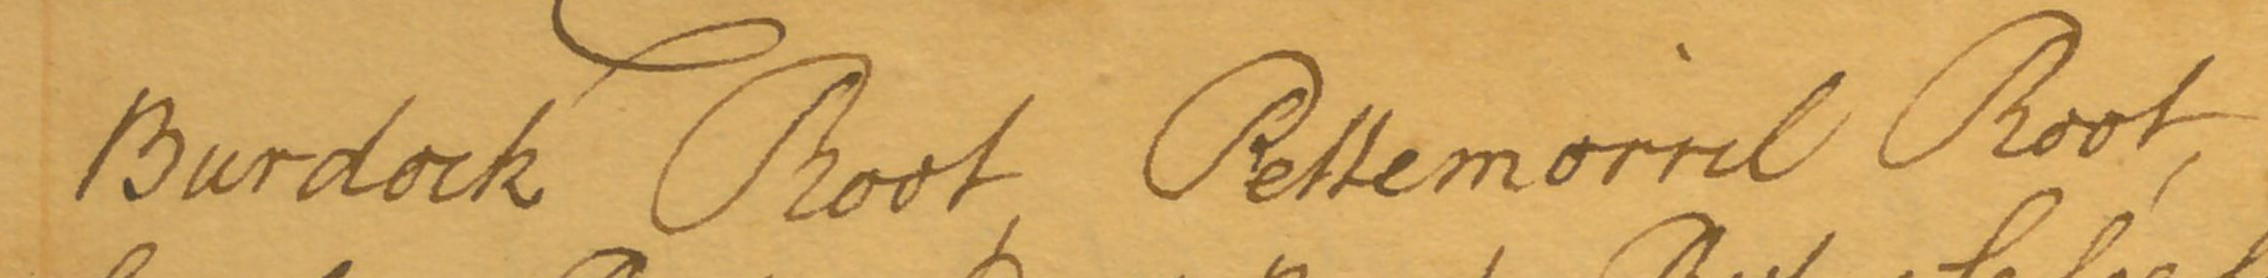Burdock Root Rettemorril Root,
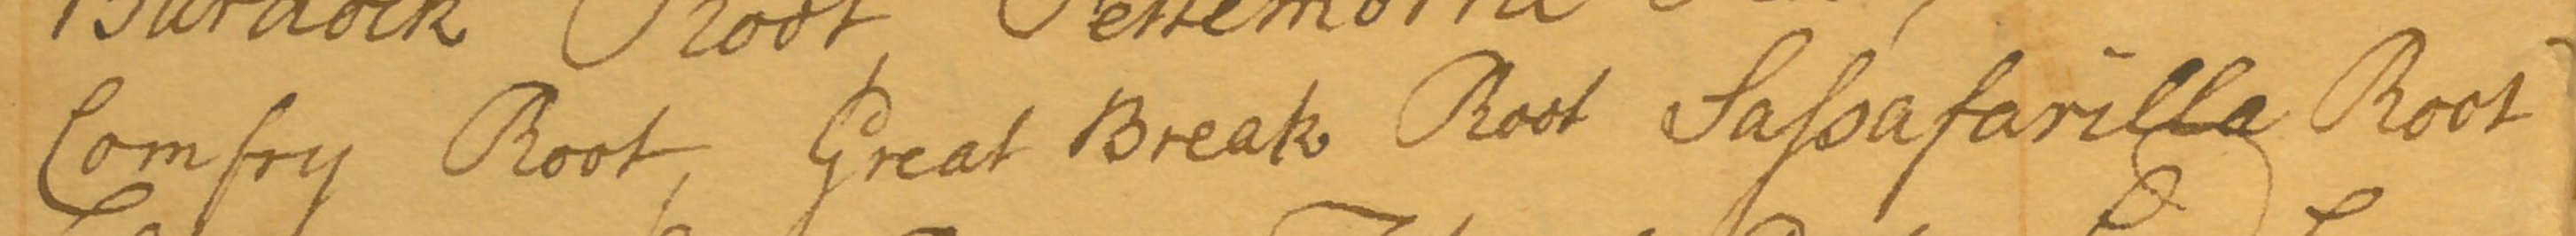Comfry Root, Great Break Root Sassafarilla Root
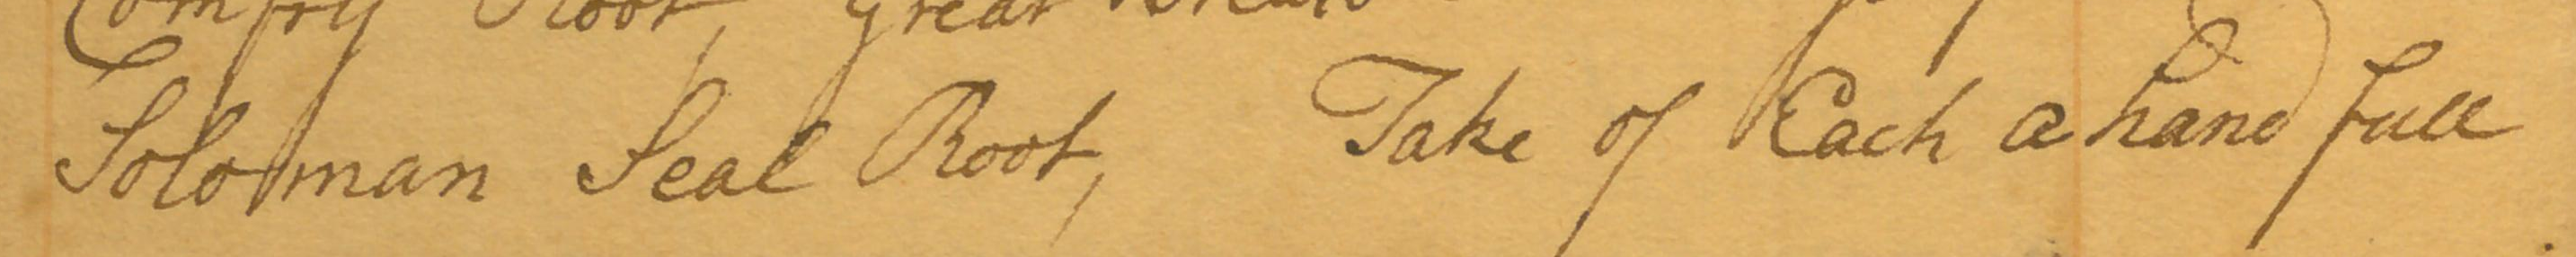Soloman Seal Root, Take of Each a hand full
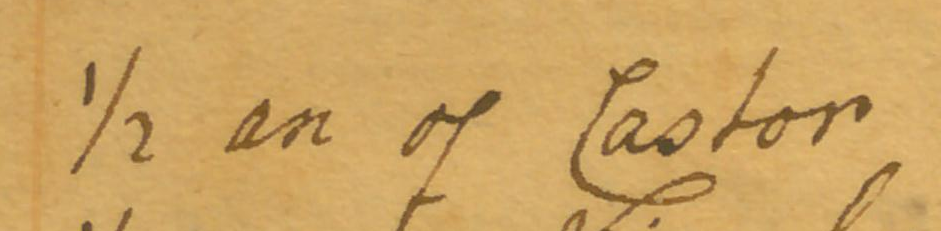1/2 an of Castor
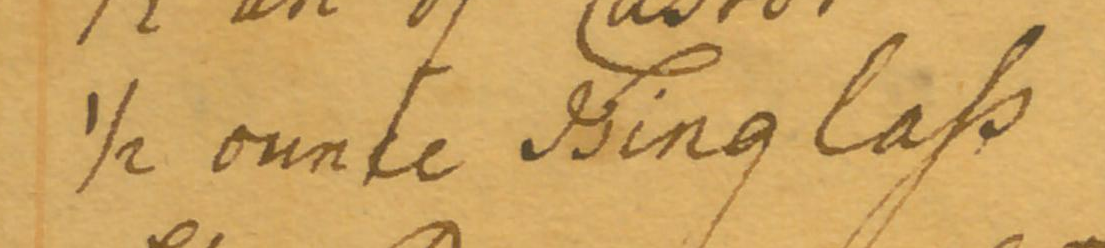1/2 ounce ringlass
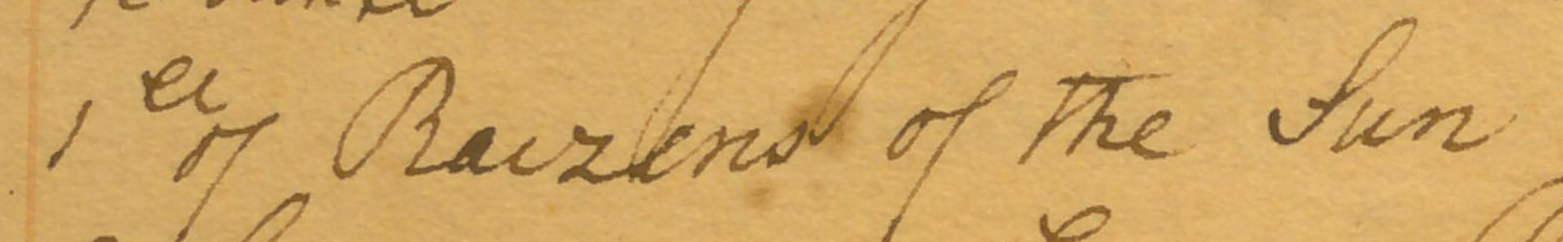1 ^lb of Raizens of the sun
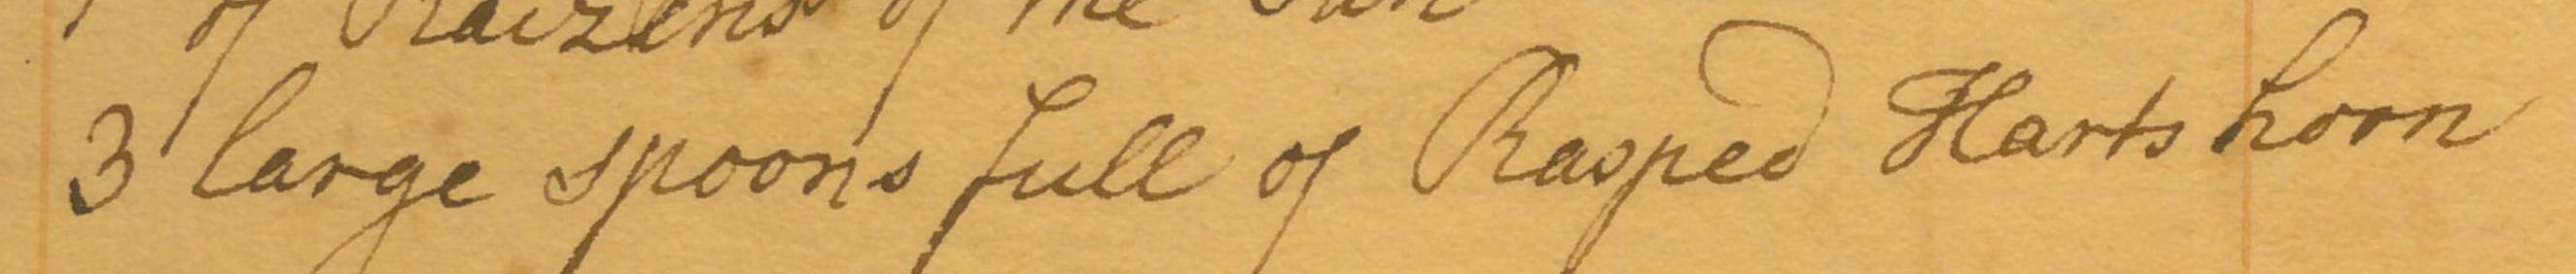3 large spoons full of Rasped Hartshorn
